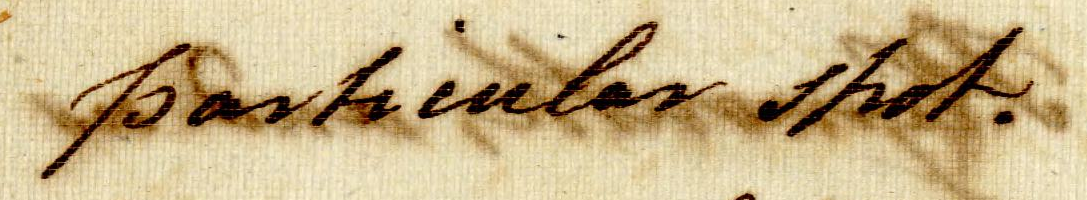particular spot.
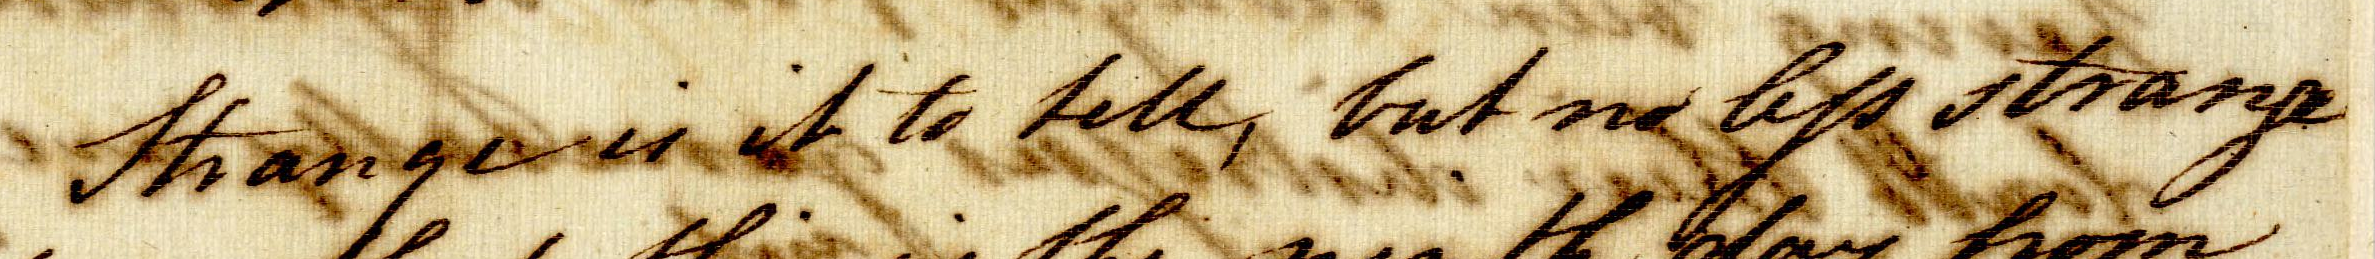Strange is it to tell, but no less strange
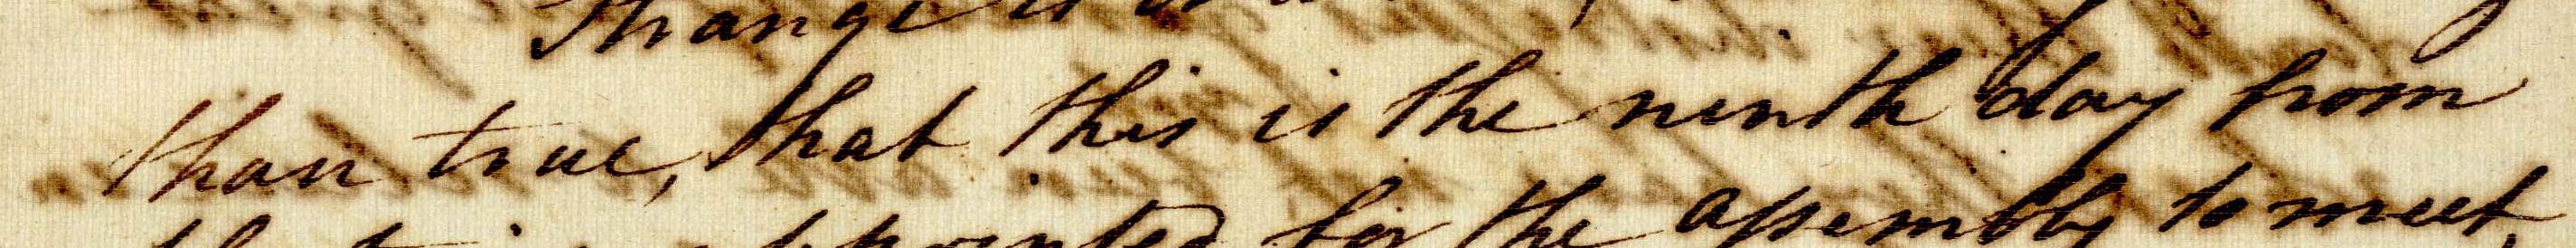than true, that this is the ninth day from
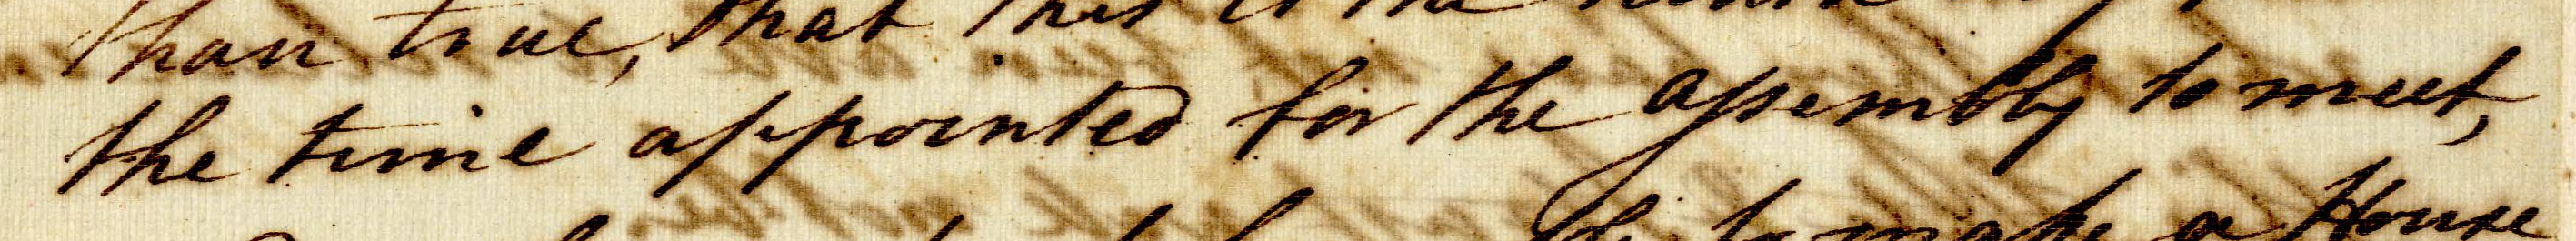the time appointed for the assembly to meet,
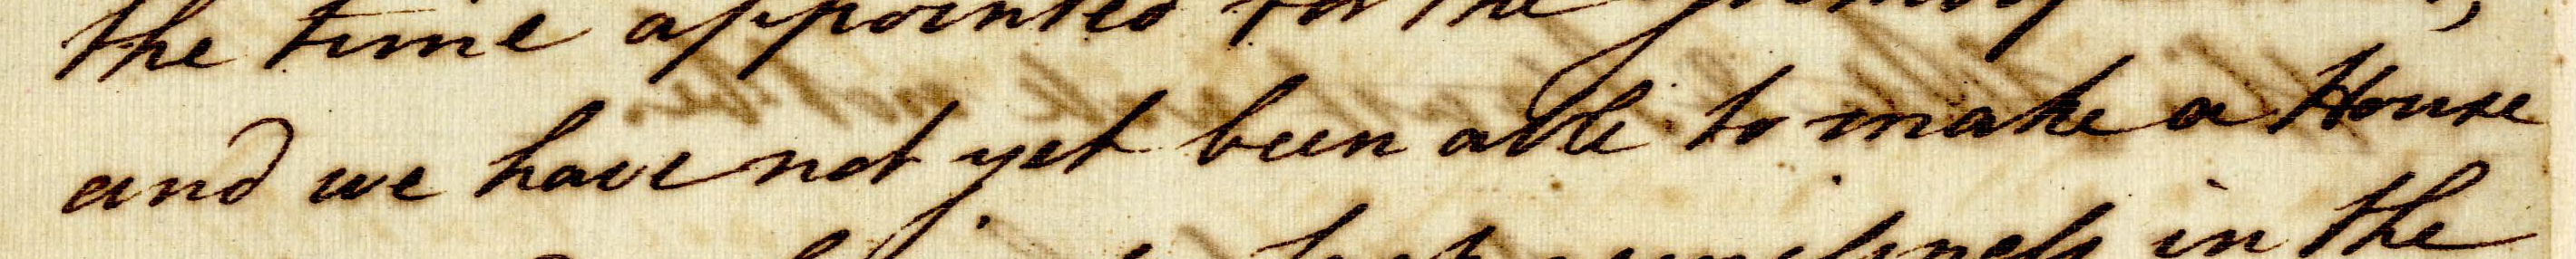and we have not yet been able to make a House
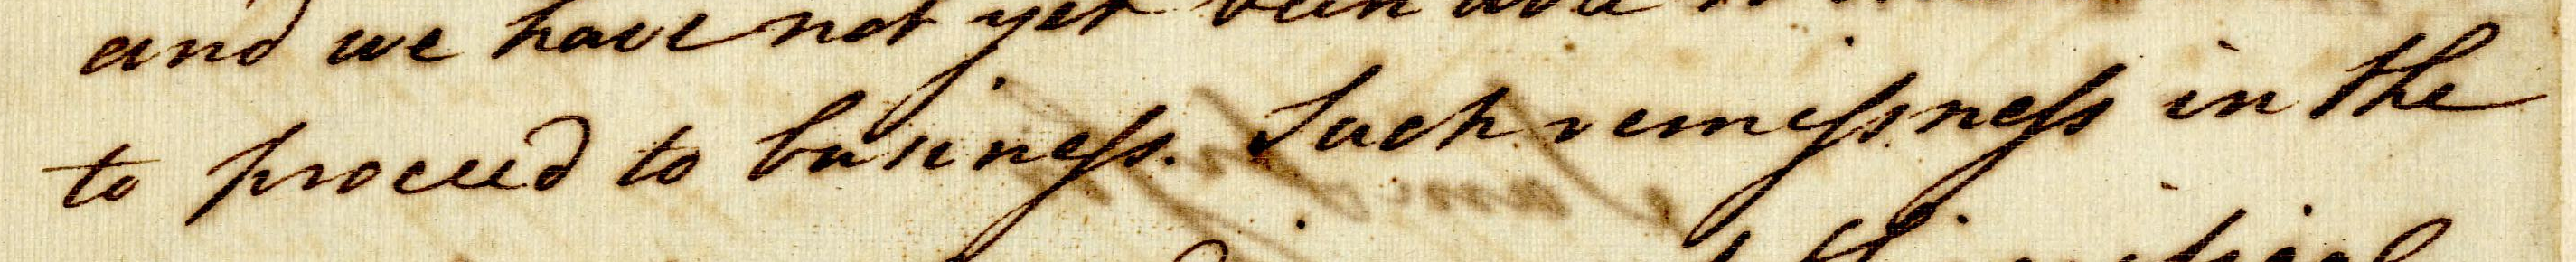to proceed to business. Such remissness in the
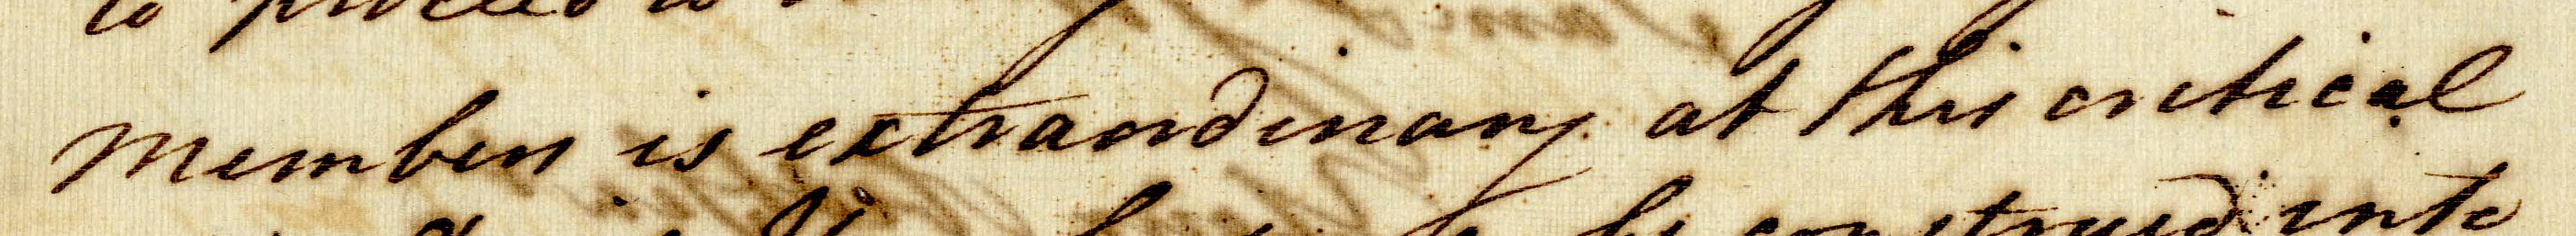members is extraordinary at this critical
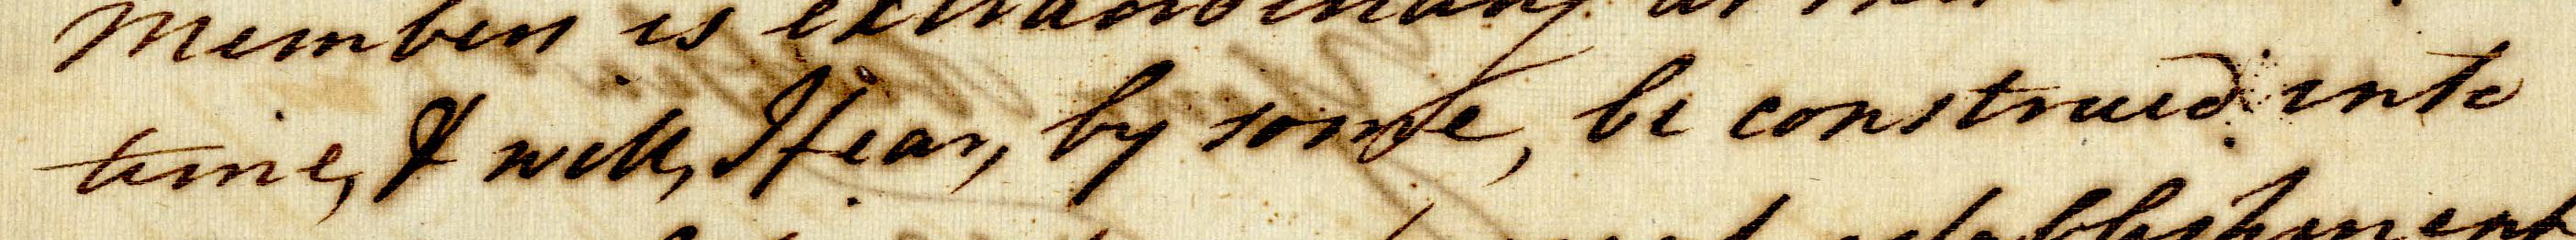time, & will, I fear, by some, be construed into
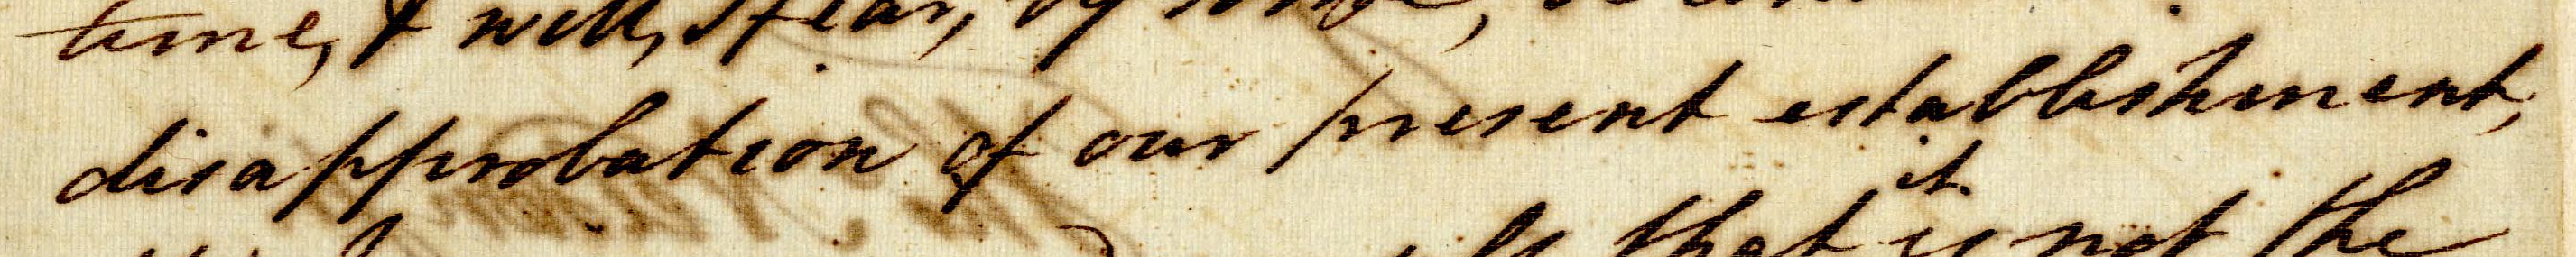disapprobation of our present establishment;
